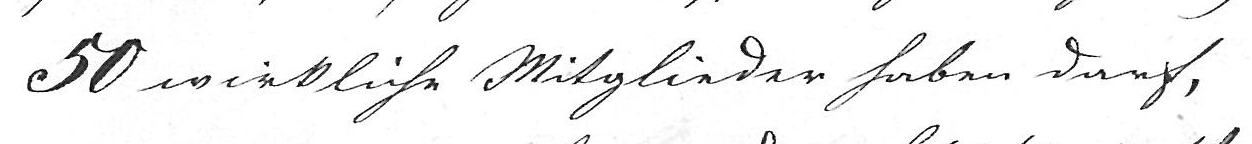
50 wirkliche Mitglieder haben darf,
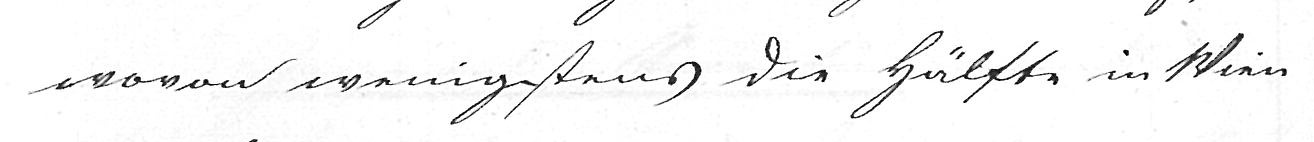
wovon wenigstens die Hälfte in Wien
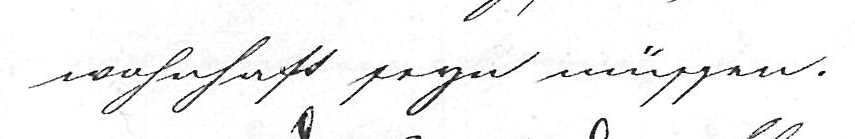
wohnhaft seyn müssen.
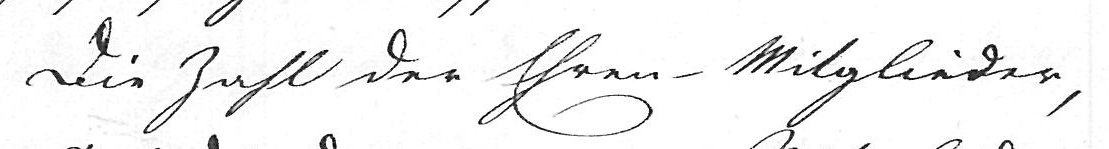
Die Zahl der Ehren-Mitglieder,
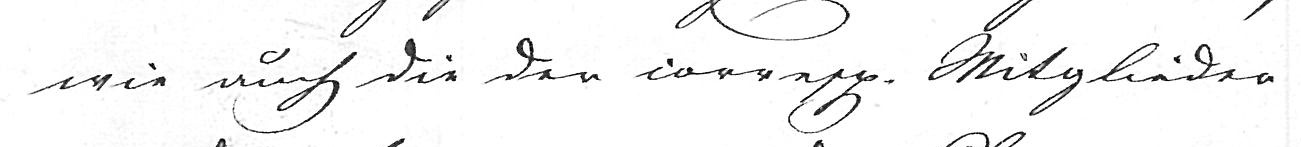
wie auch die der corresp. Mitglieder
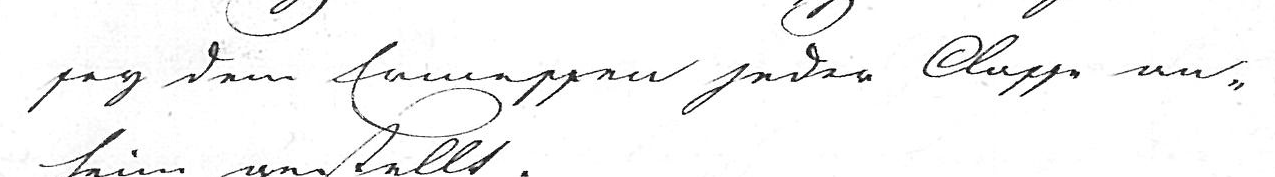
sey dem Ermessen jeder Classe an-
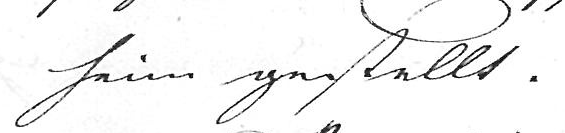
heim gestellt.
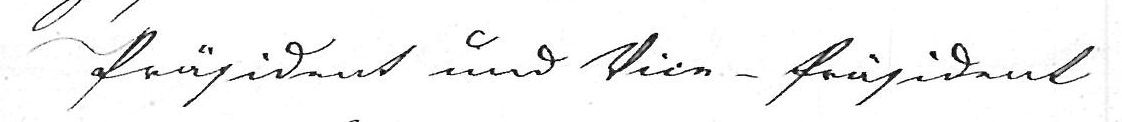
Präsident und Vice-Präsident
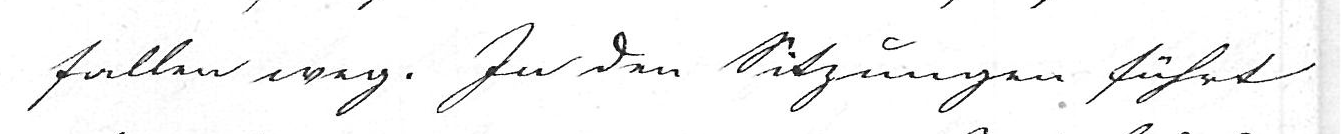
fallen weg. In den Sitzungen führt
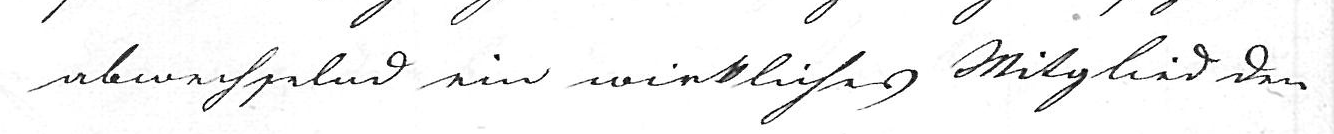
abwechselnd ein wirkliches Mitglied den
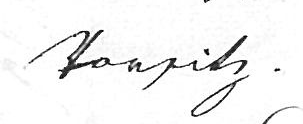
Vorsitz.
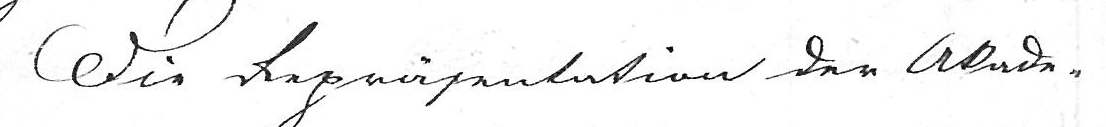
Die Repräsentation der Akade-
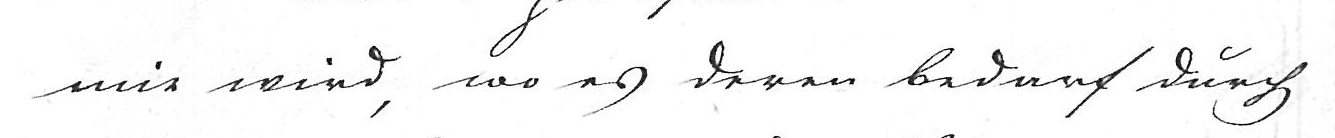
mie wird, wo es deren bedarf durch
